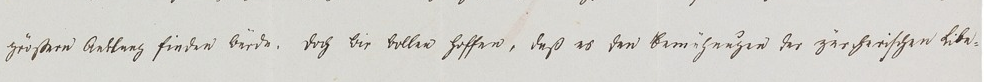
größern Anklang finden würde. Doch wir wollen hoffen, daß es den Bemühungen der zürcherischen Libe-
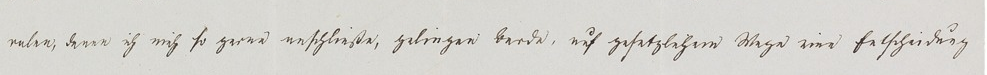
ralen, denen ich mich so gerne anschließe, gelingen werde, auf gesetzlichem Wege eine Entscheidung
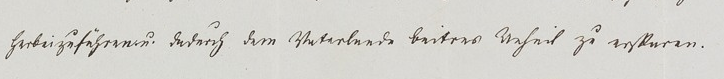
herbeizuführen u. dadurch dem Vaterlande weitres Unheil zu ersparen.
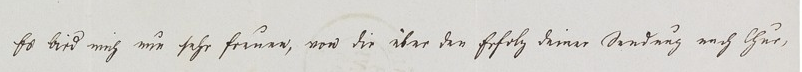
Es wird mich nun sehr freuen, von Dir über den Erfolg Deiner Sendung nach Chur,
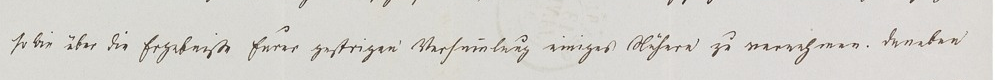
sowie über die Ergebnisse Eurer gestrigen Versammlung einiges Nähere zu vernehmen. Daneben
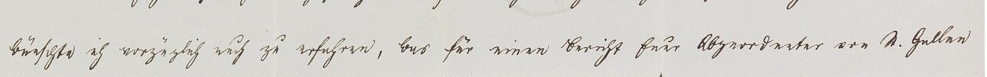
wünschte ich vorzüglich auch zu erfahren, was für einen Bericht Euer Abgeordneter von St. Gallen
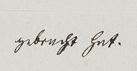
gebracht hat.
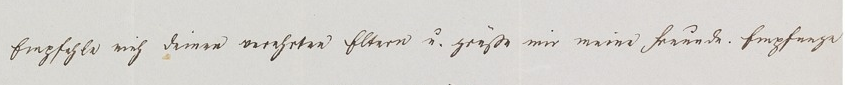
Empfehle mich Deinen verehrten Eltern u. grüße mir meine Freunde. Empfange
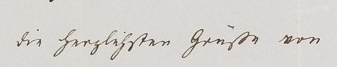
die herzlichsten Grüße von
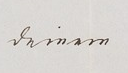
Deinem
